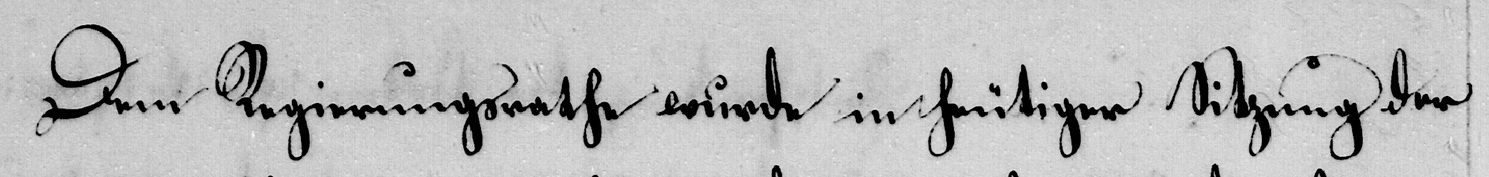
Dem Regierungsrathe wurde in heutiger Sitzung der
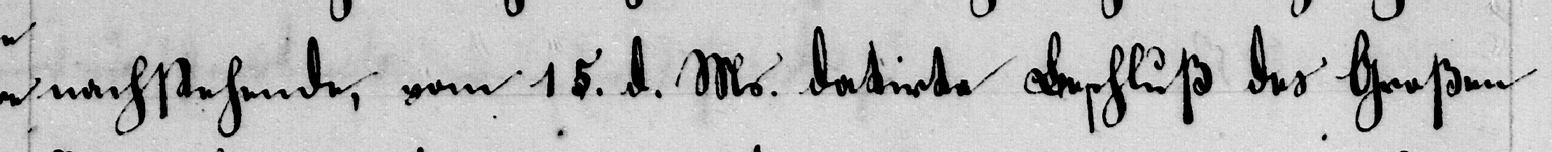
nachstehende, vom 15. d. Ms. datirte Beschluß des Großen
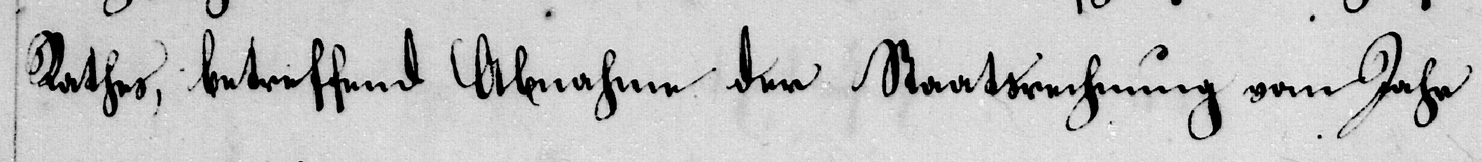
Raths, betreffend Abnahme der Staatsrechnung vom Jahre
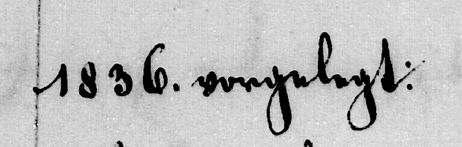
1836. vorgelegt.
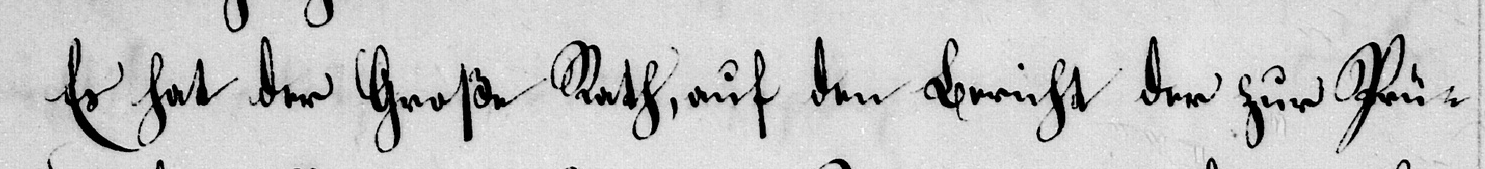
Es hat der Große Rath, auf den Bericht der zur Prü¬
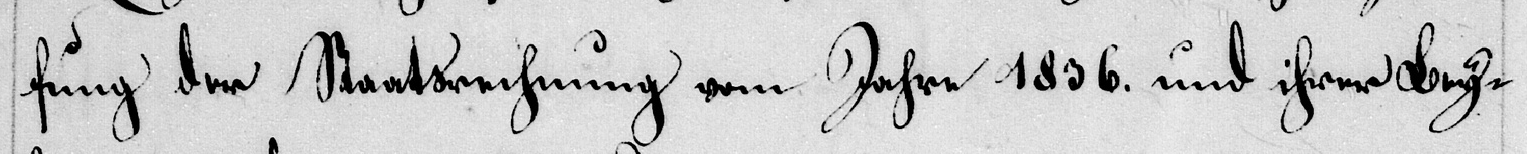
fung der Staatsrechnung vom Jahre 1836. und ihrer Bey¬
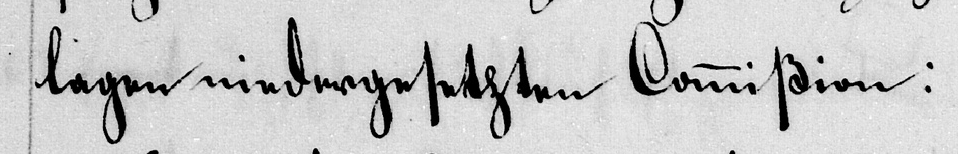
lagen niedergesetzten Commißion:
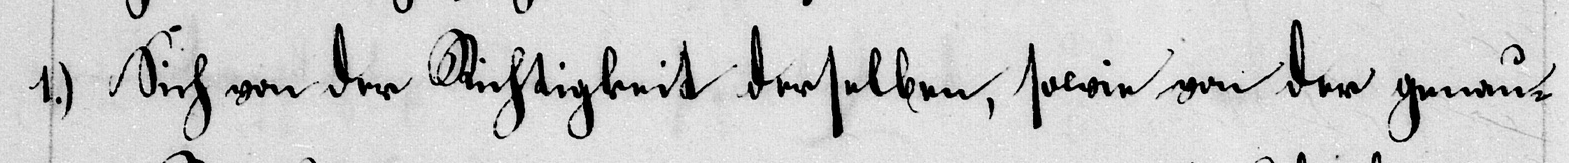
1.) Sich von der Richtigkeit derselben, sowie von der genau¬
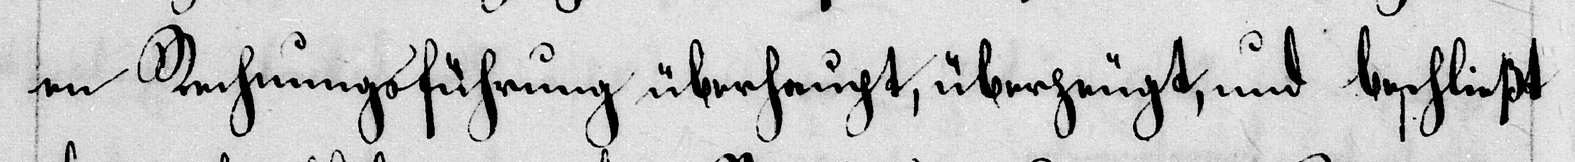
en Rechnungsführung überhaupt, überzeugt, und beschließt
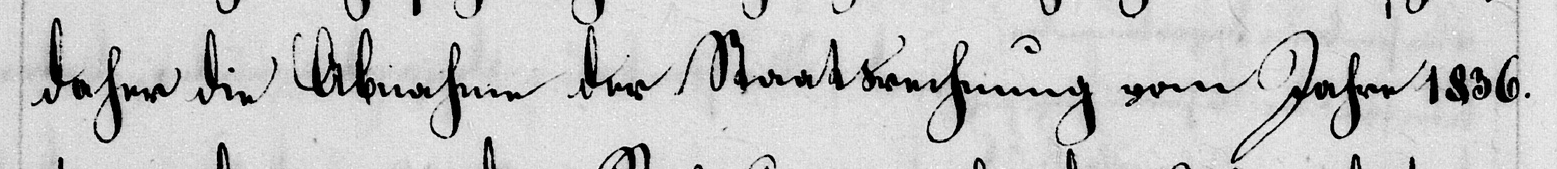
daher die Abnahme der Staatsrechnung vom Jahre 1836.
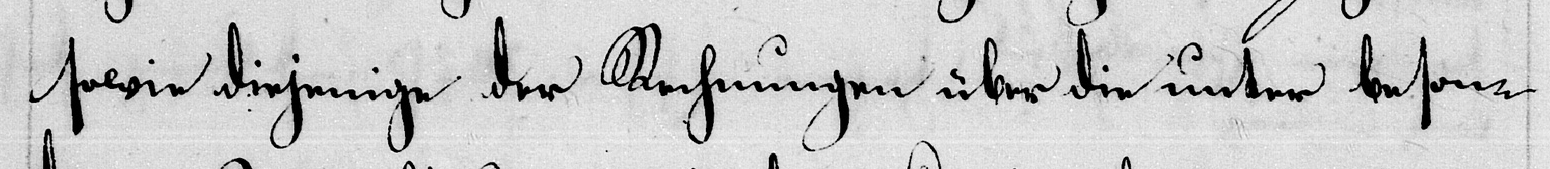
sowie diejenige der Rechnungen über die unter beson¬
